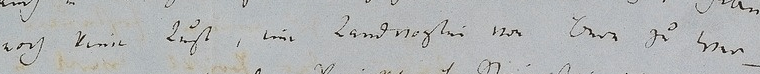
noch keine Lust, eine Landvogtei von Bern zu wer-
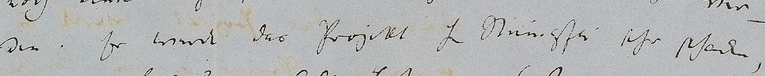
den. Es werde das Projekt Herrn Stämpfli sehr schaden,
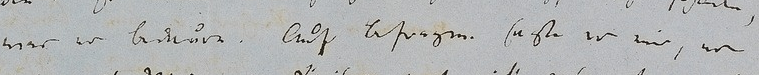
was er bedaure. Auf Befragen sagte er mir, er
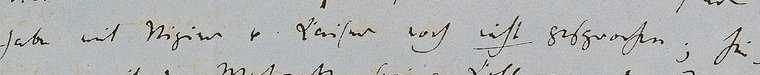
habe mit Vigier &. Kaiser noch nicht gesprochen; Hin-
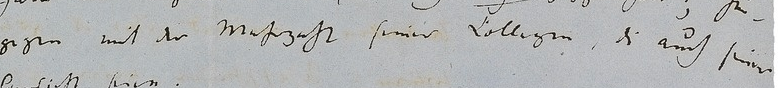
gegen mit der Mehrzahl seiner Kollegen, die auch seiner
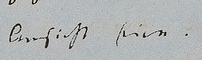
Ansicht seien.
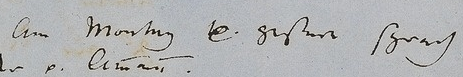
Am Montag &. gestern sprach
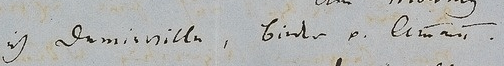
ich Demieville, Bieder &. Ammann.
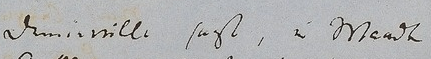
Demieville sagt, in Waadt
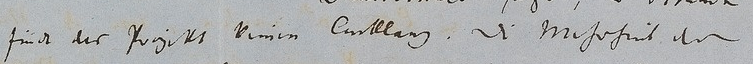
finde das Projekt keinen Anklang. Die Mehrheit der
